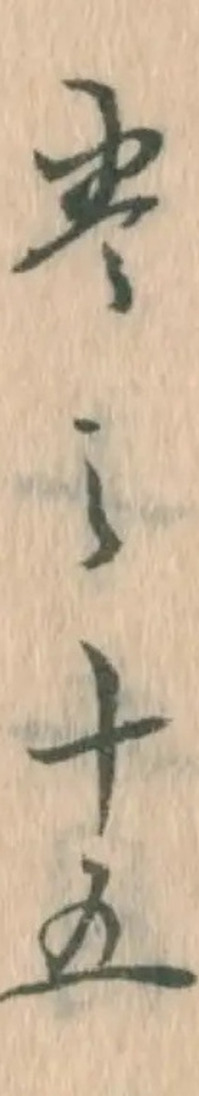巻之十五
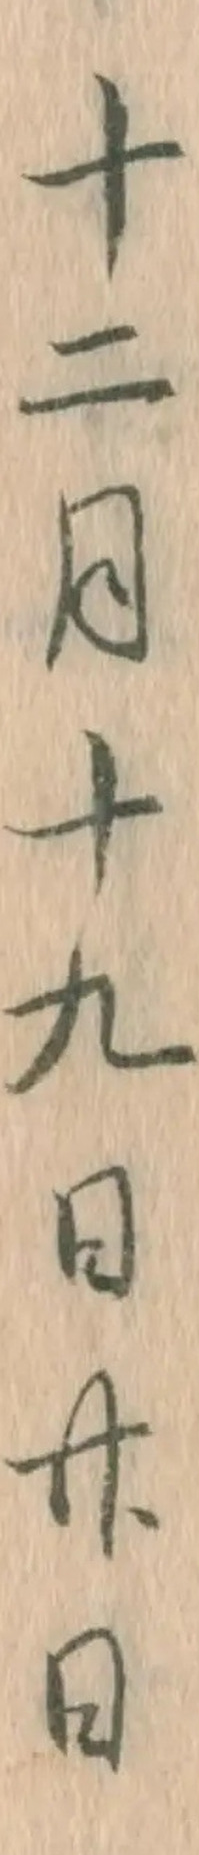十二月十九日廿日
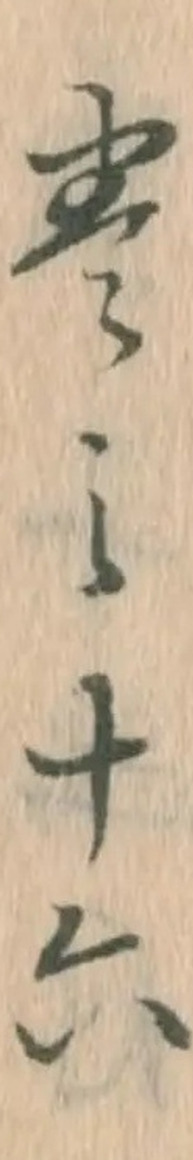巻之十六
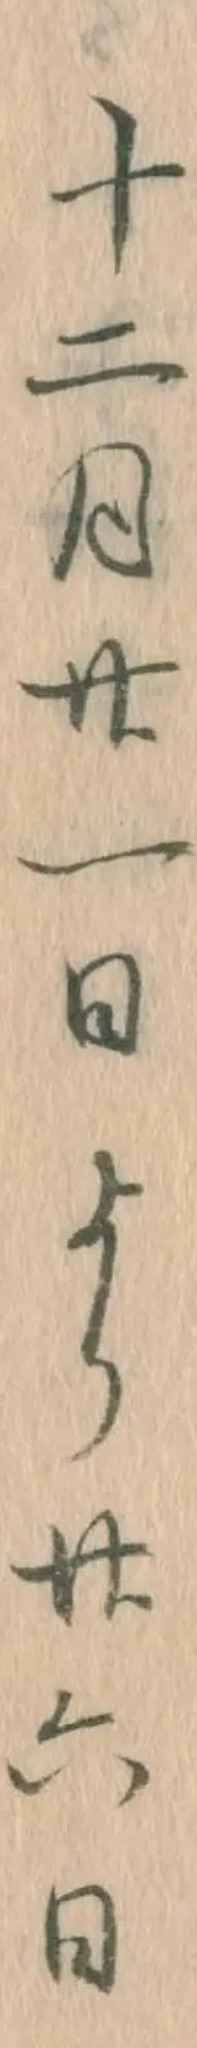十二月廿一日より廿六日
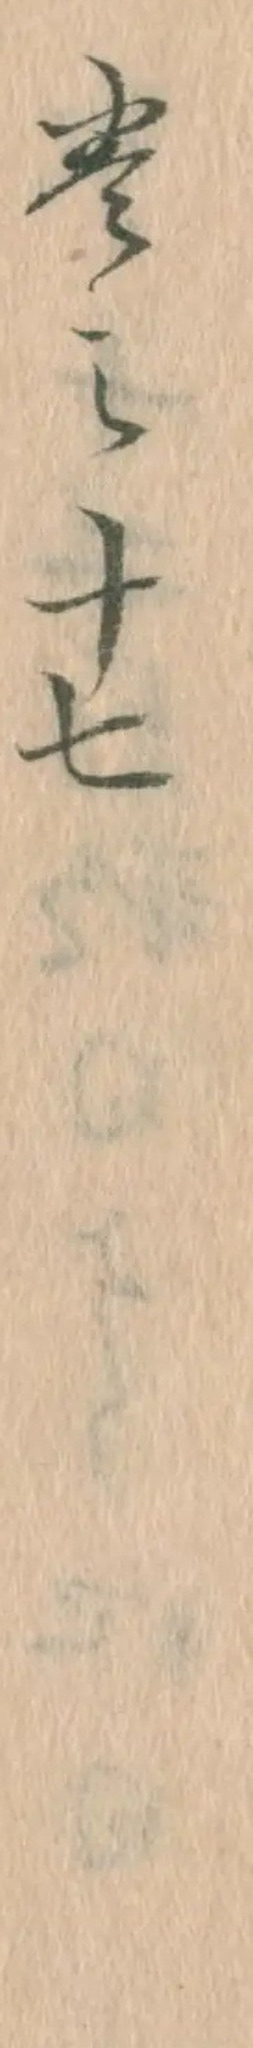巻之十七
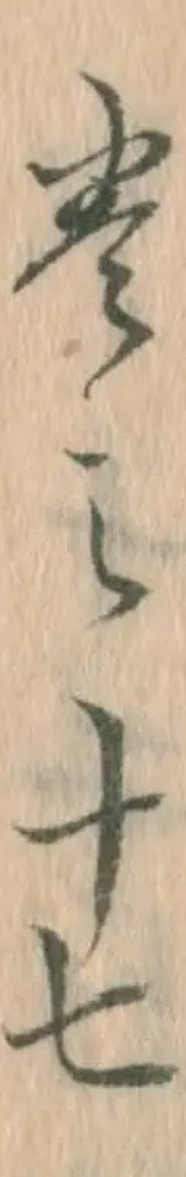巻之十七
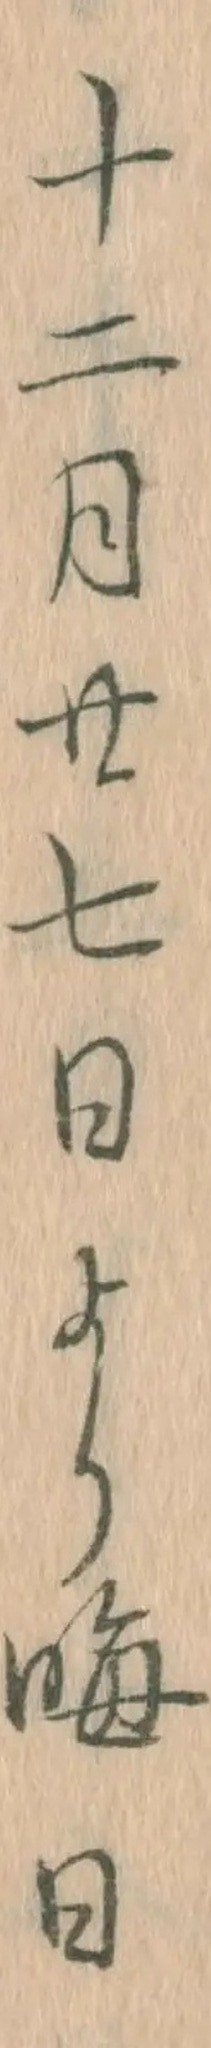十二月廿七日より晦日
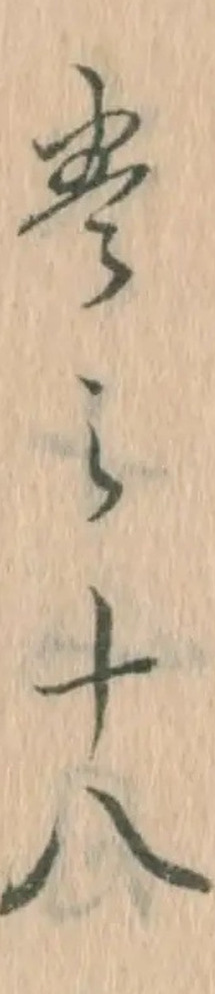巻之十八
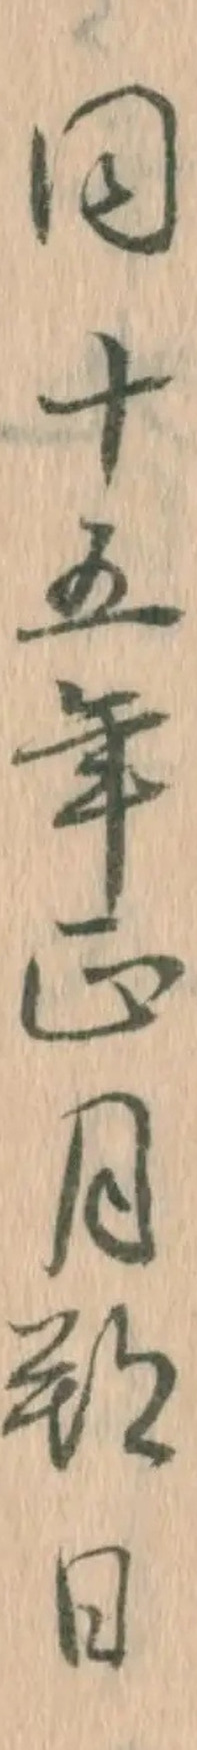同十五年正月朔日
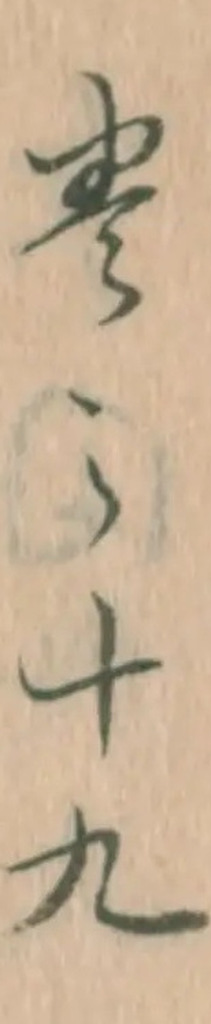巻之十九
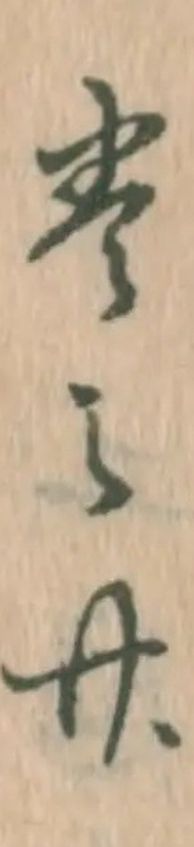巻之廿
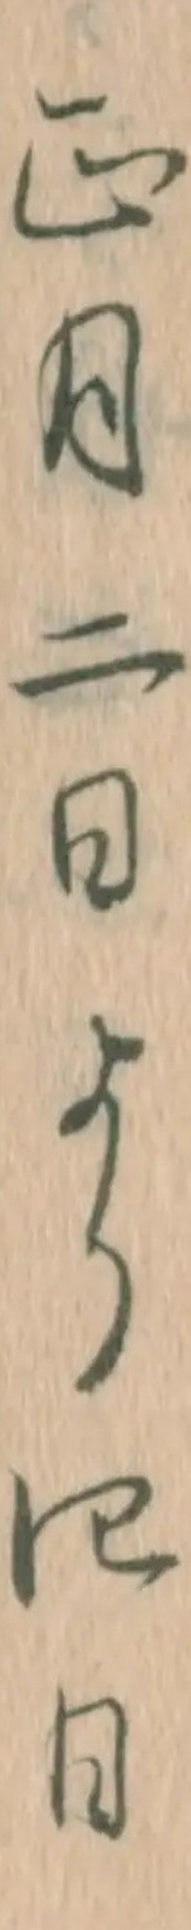正月二日より四日
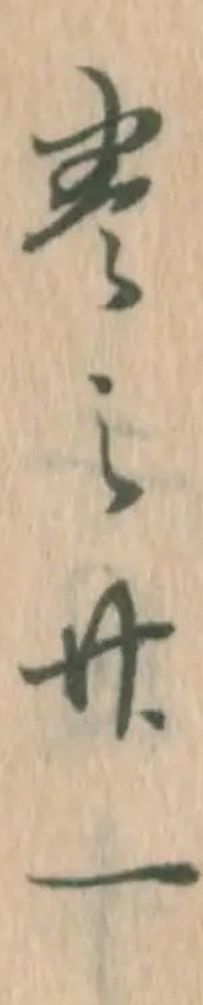巻之廿一
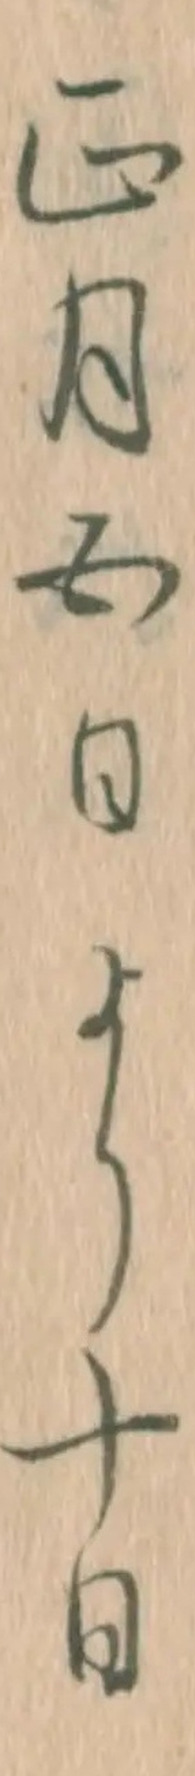正月五日より十日
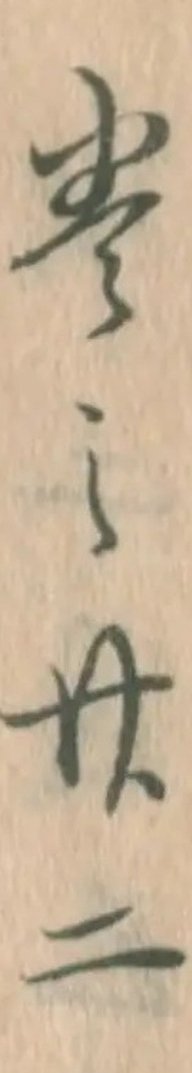巻之廿二
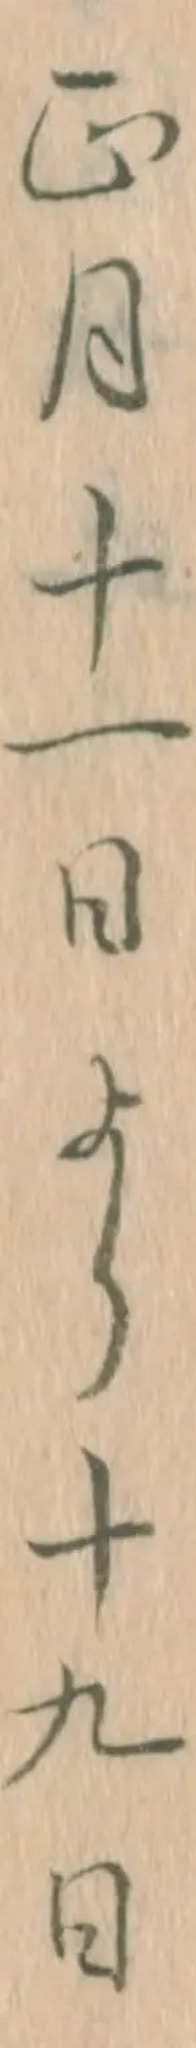正月十一日より十九日
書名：切支丹御退治記 49巻. [1]
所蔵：国立国会図書館 National Diet Library, JAPAN
